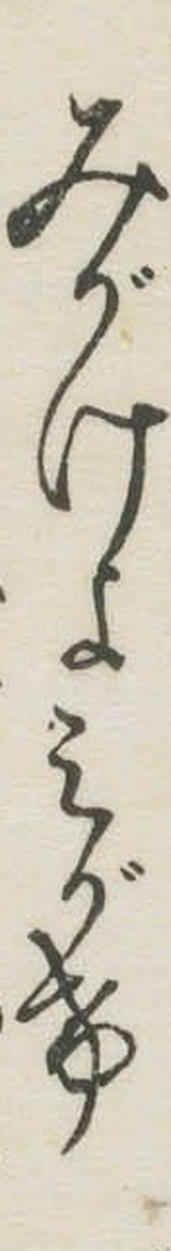みがけよみがけ
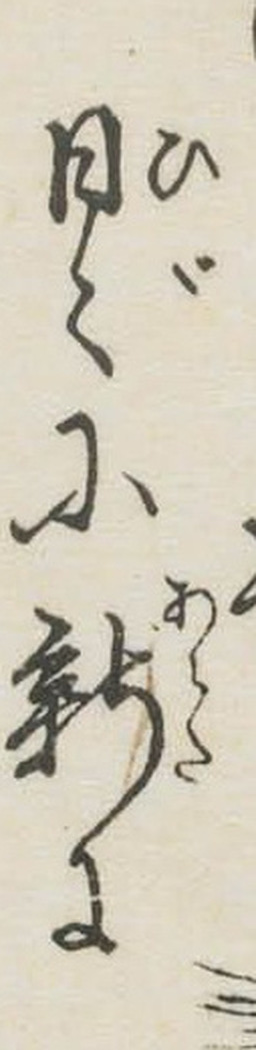日々に新に
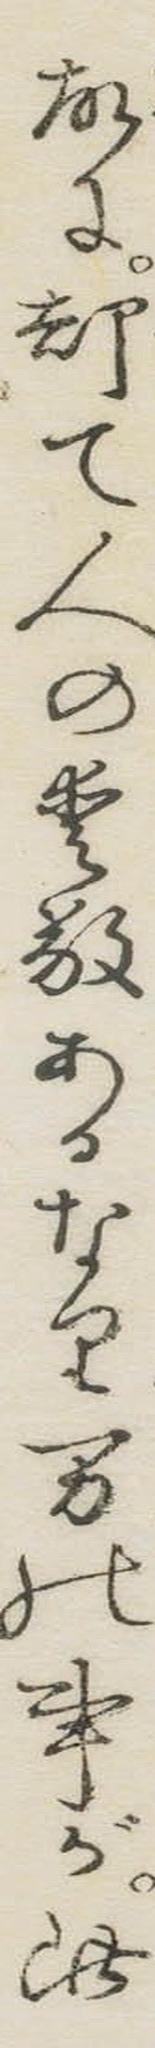故に。却て人の愛敬あるなり。万の事が。此
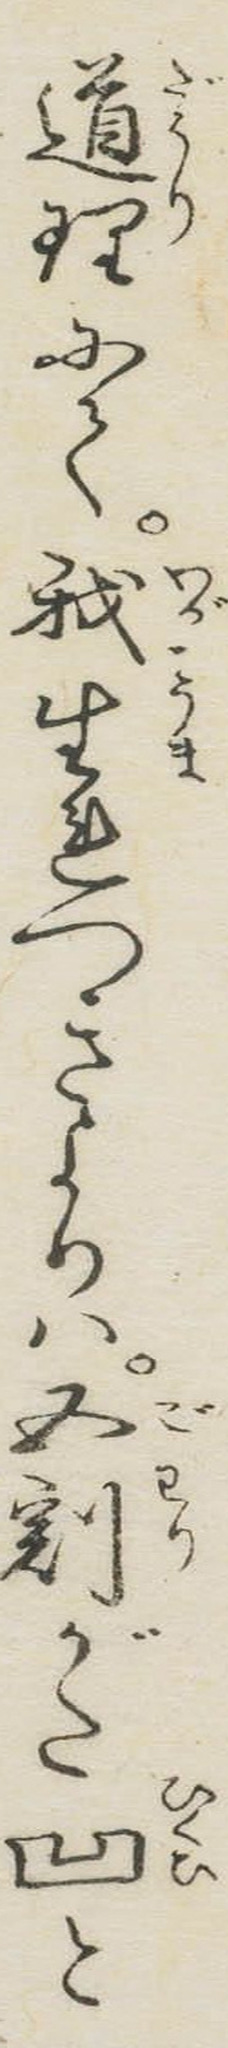道理にて。我生れつきよりは。五割がた凹と
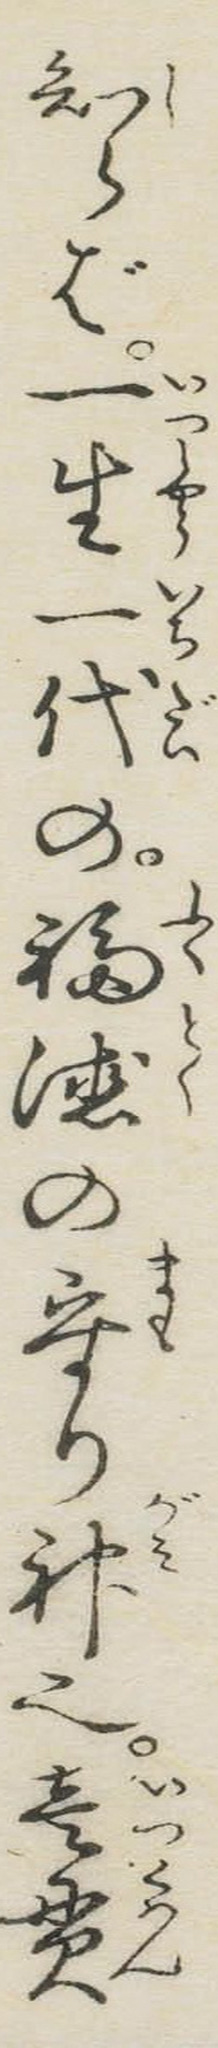知らば。一生一代の。福徳の守り神也。壱貫
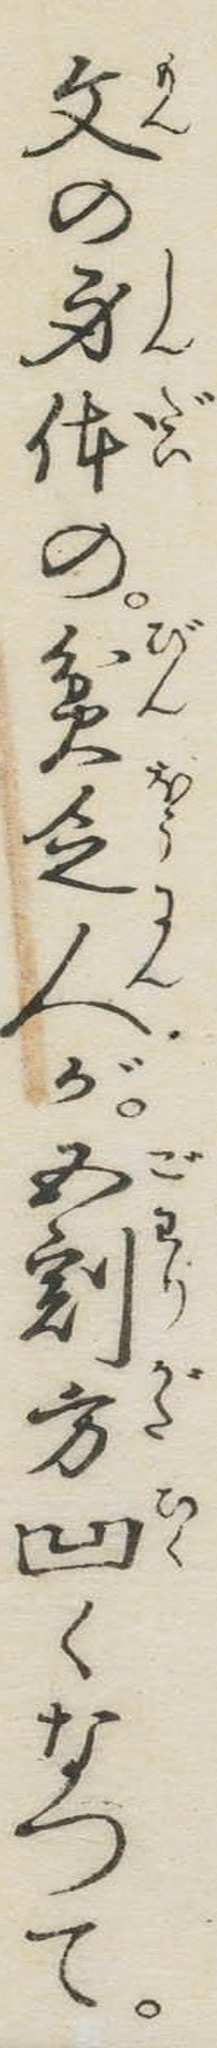文の身体の。貧乏人が。五割方凹くなつて。
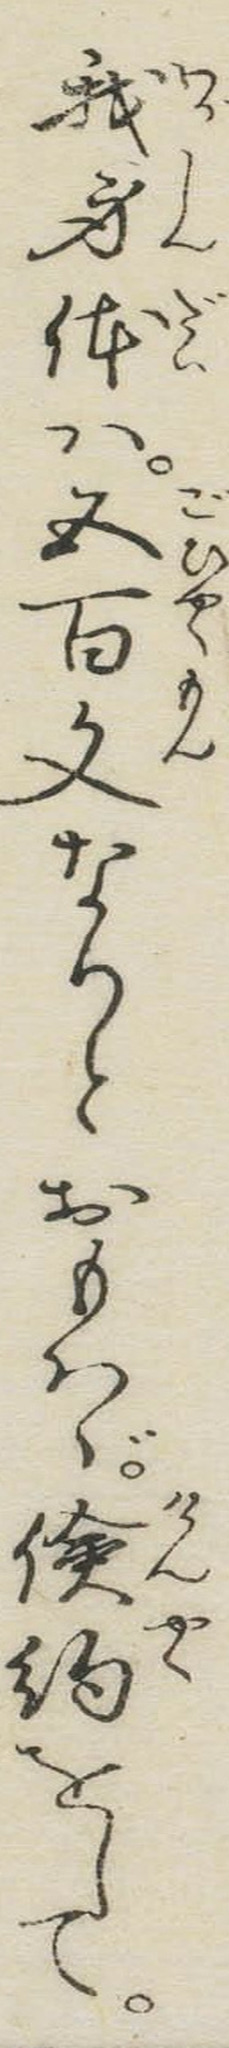我身体は。五百文なりとおもはゞ。倹約をして。
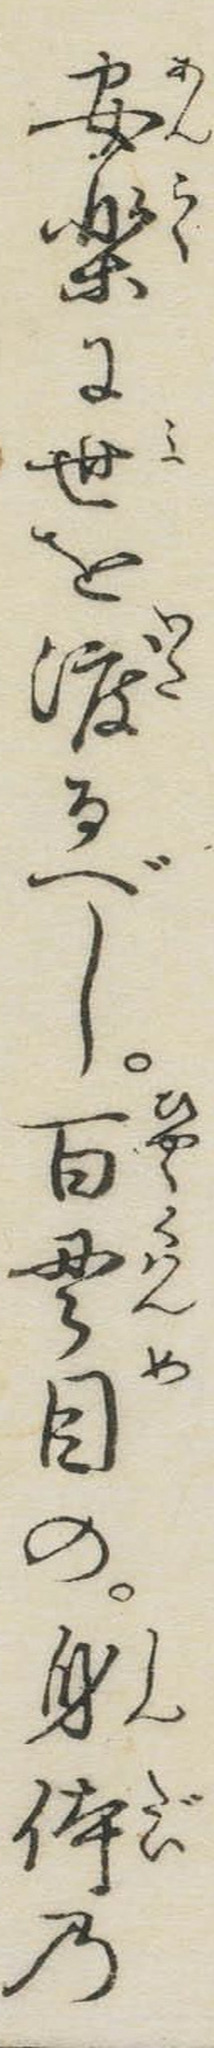安楽に世を渡るべし。百貫目の。身体の
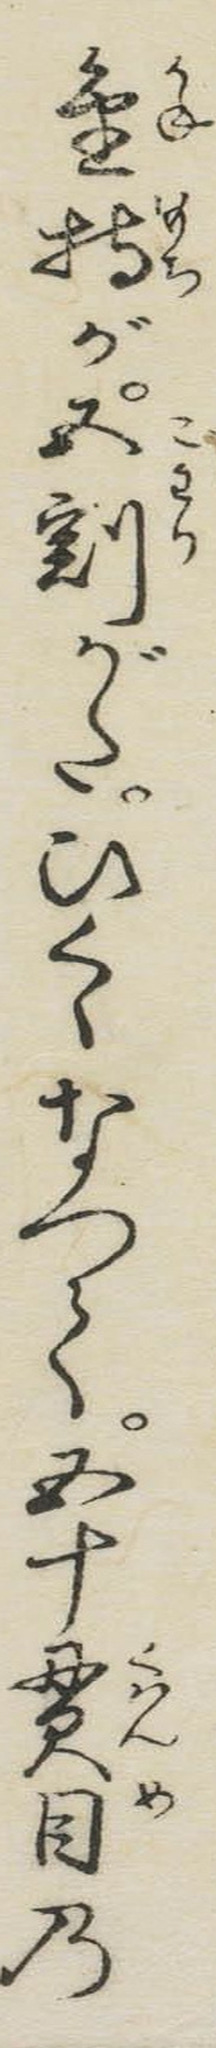金持が。五割がた。ひくゝなつて。五十貫目の
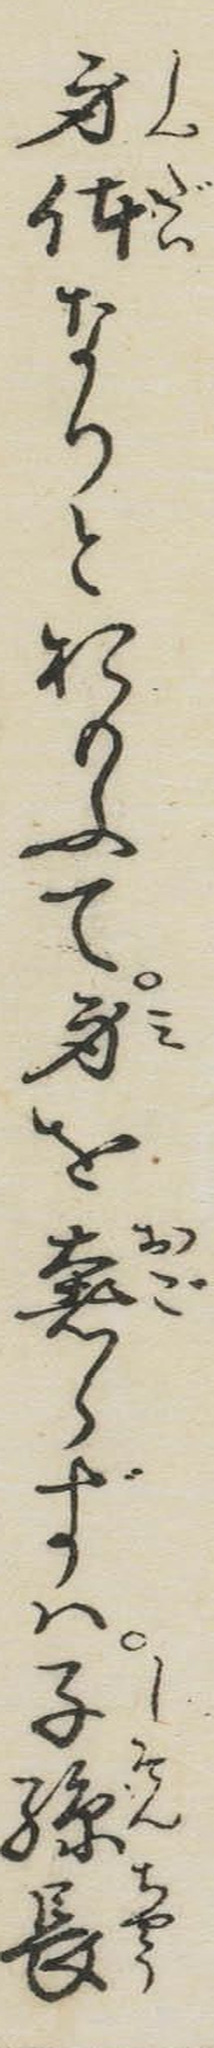身体なりとおもふて。身を奢らずは。子孫長

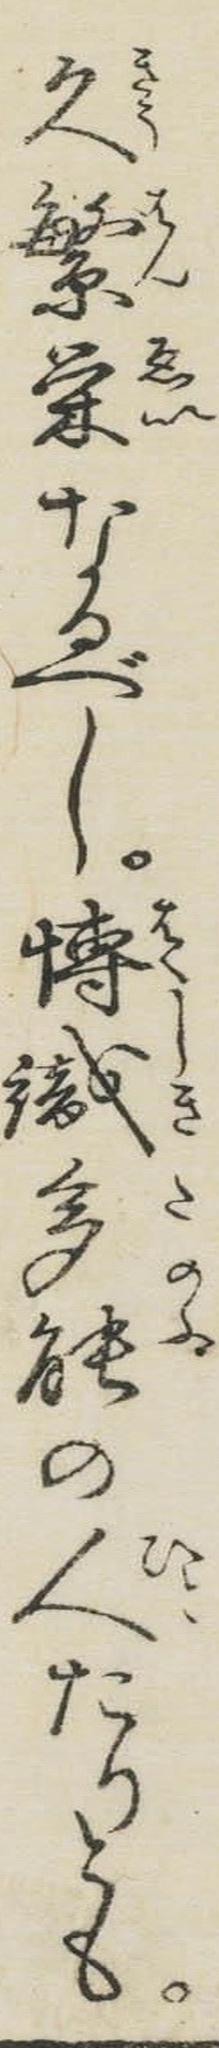久繁栄なるべし。博識多能の人たりとも。
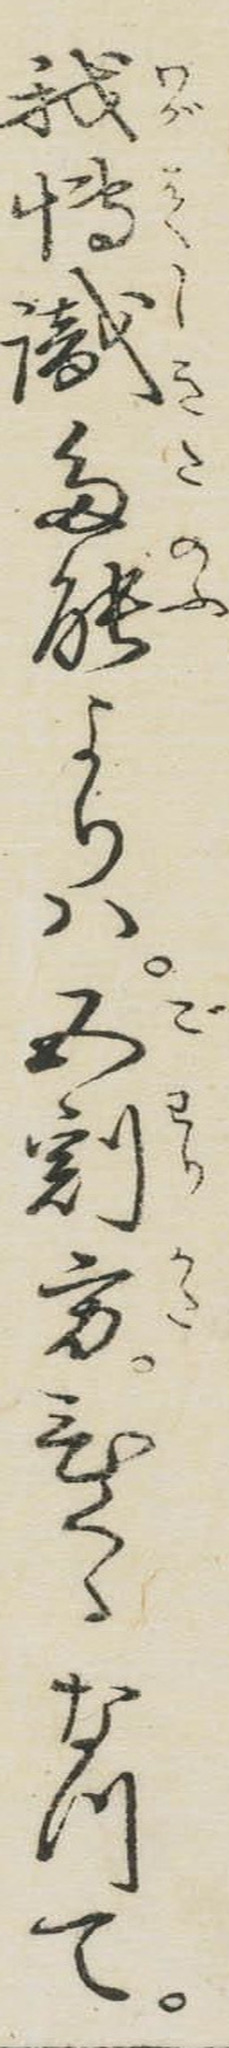我博識多能よりは。五割方。ひくゝなつて。
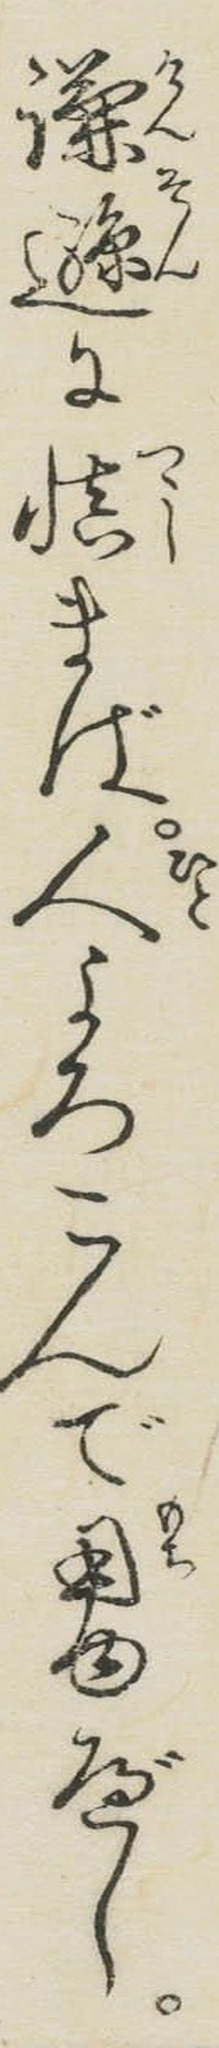謙遜に慎まば。人よろこんで用ゆべし。
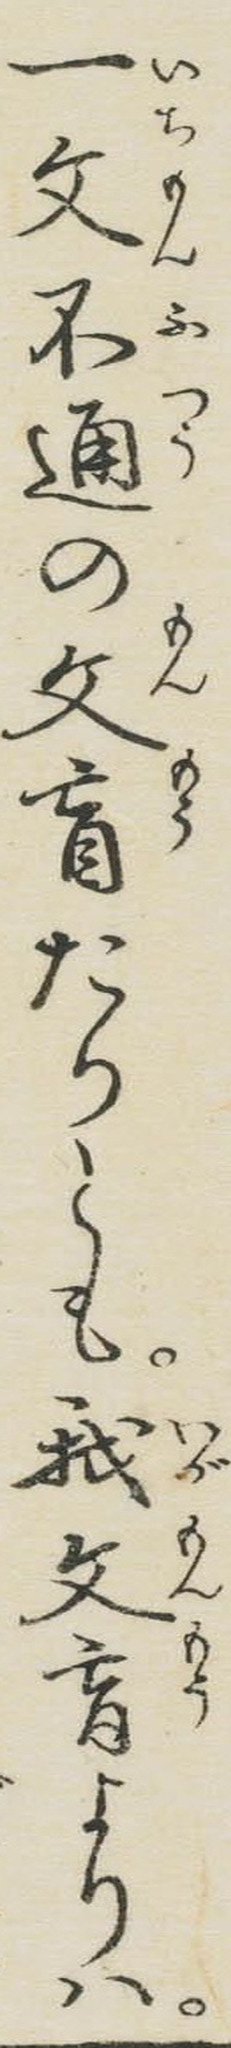一文不通の文盲たりとも。我文盲よりは。
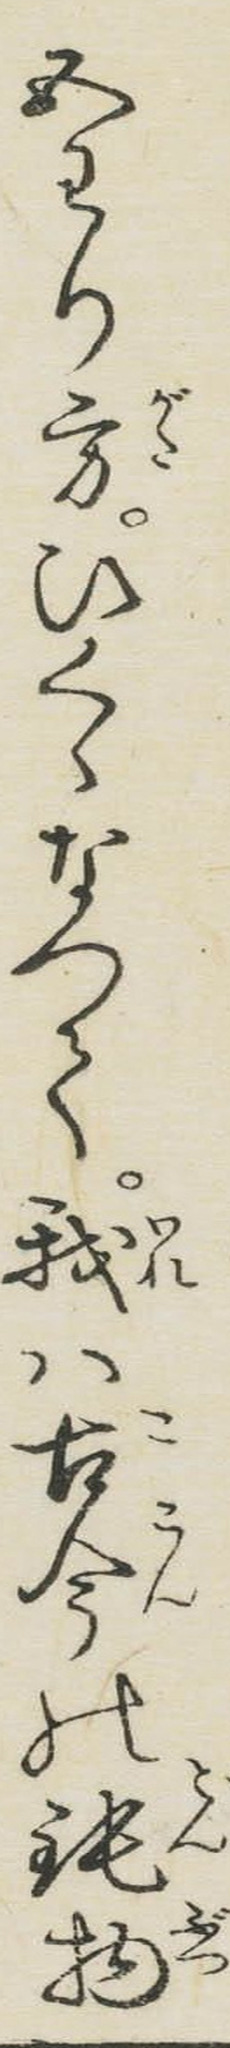五わり方。ひくゝなつて。我は古今の鈍物
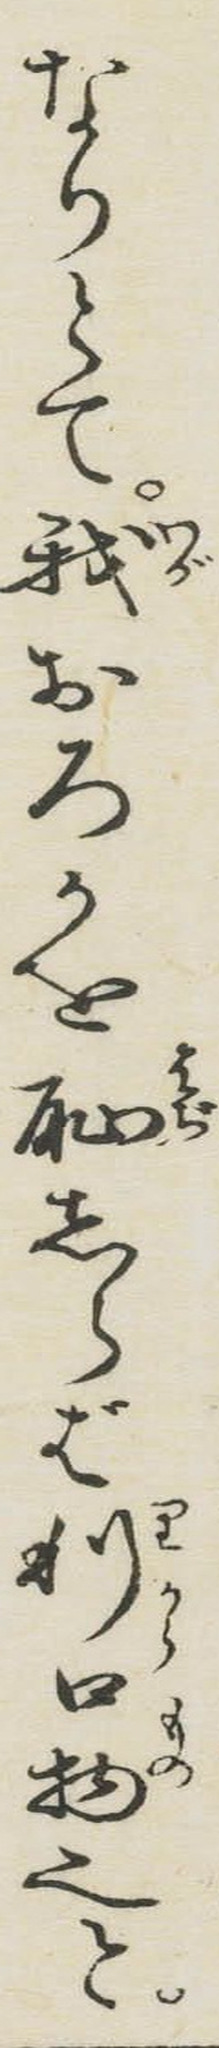なりとて。我おろかを恥しらば利口物也と。
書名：福神おしへの小槌 2巻 上
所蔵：東京学芸大学教育コンテンツアーカイブ
